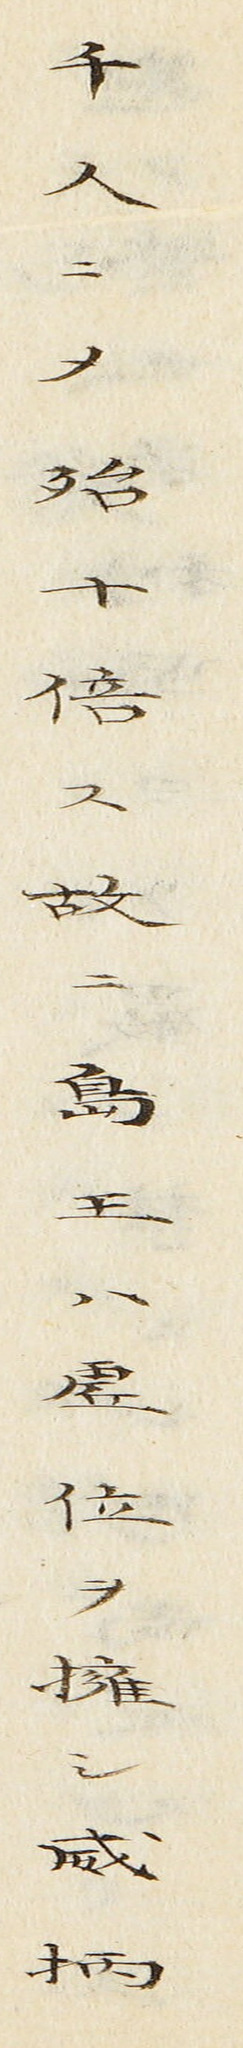千人ニシテ殆十倍ス故ニ島王ハ虚？位ヲ擁シ威柄
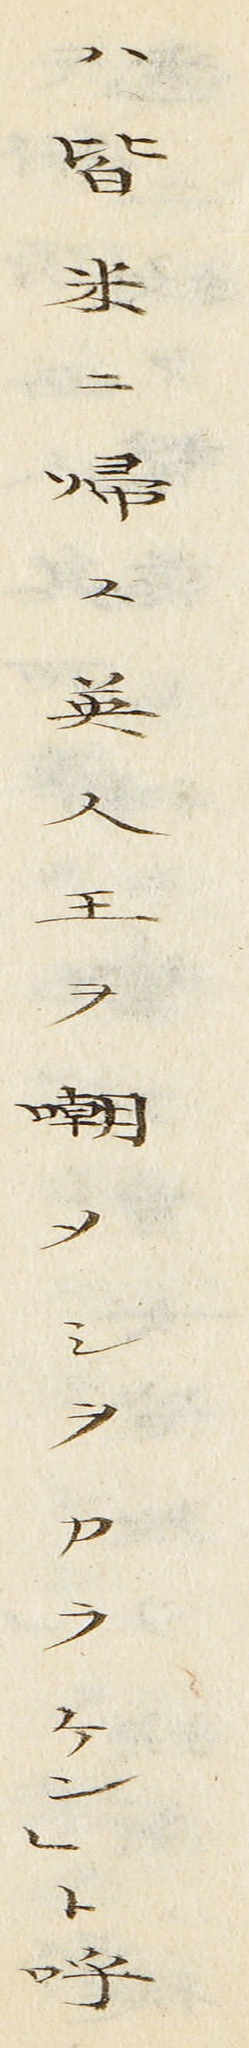ハ皆米ニ帰ス英人王ヲ嘲シテシヲカラケン」ト呼
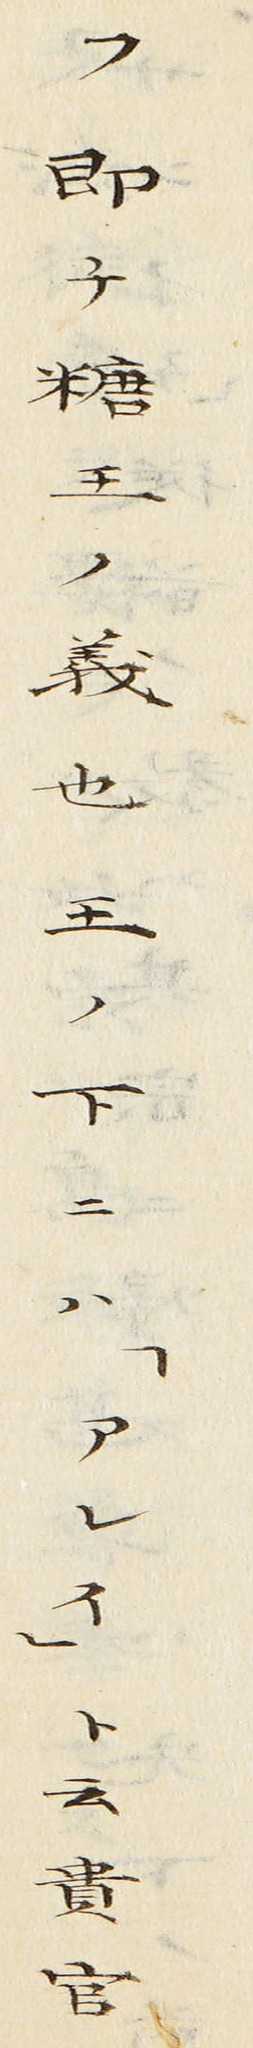フ即チ糖王ノ義也王ノ下ニハ「アレイ」ト云貴官
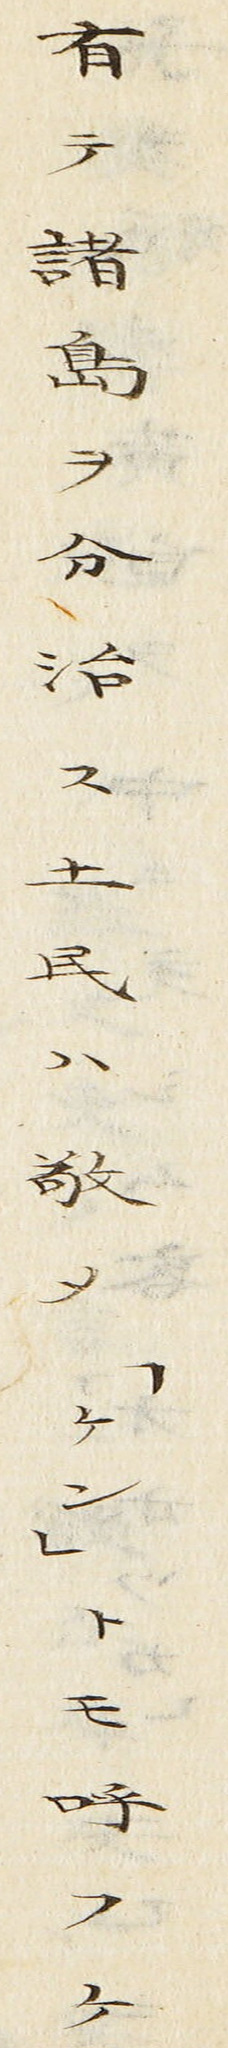有テ諸島ヲ分治ス土民ハ敬シテ「ケン」トモ呼フケ
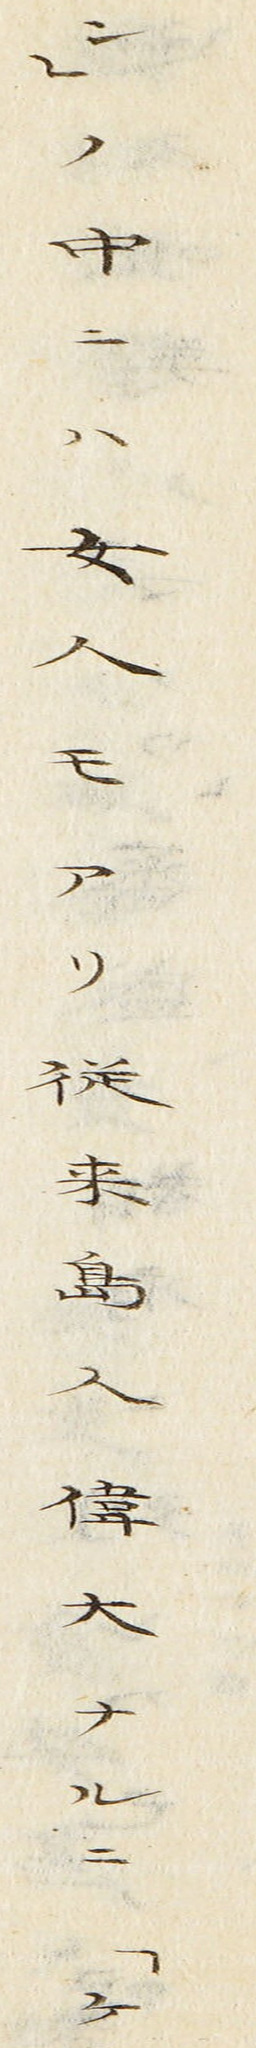ン」ノ中ニハ女人モアリ従来島人偉大ナルニ「ケ
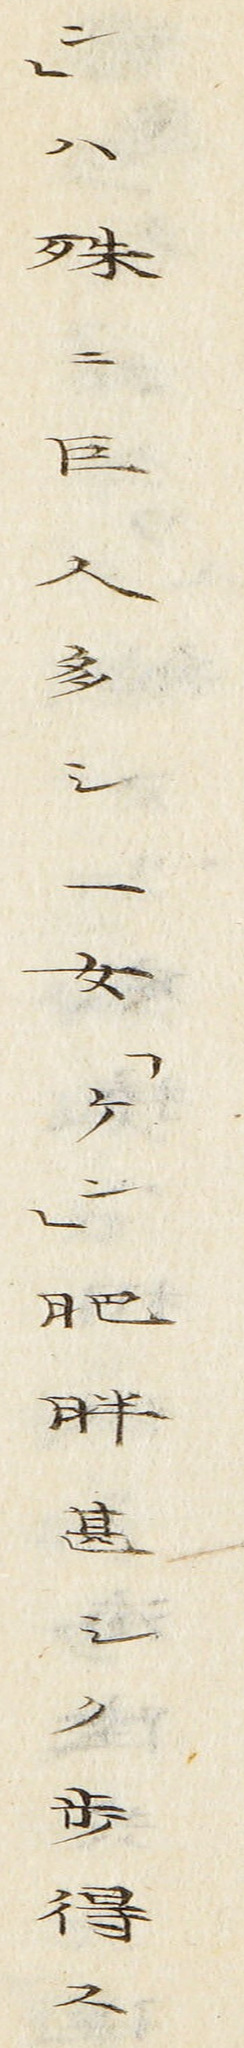ン」ハ殊ニ巨人多シ一女「ケン」肥胖甚シク歩得ス
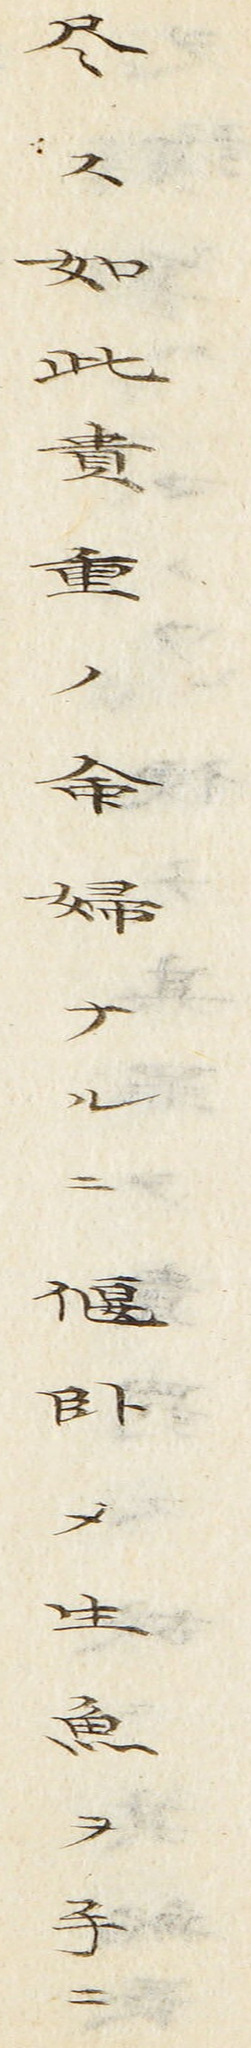尽ス如此貴重ノ命婦ナルニ偃臥シテ生魚ヲ手？ニ
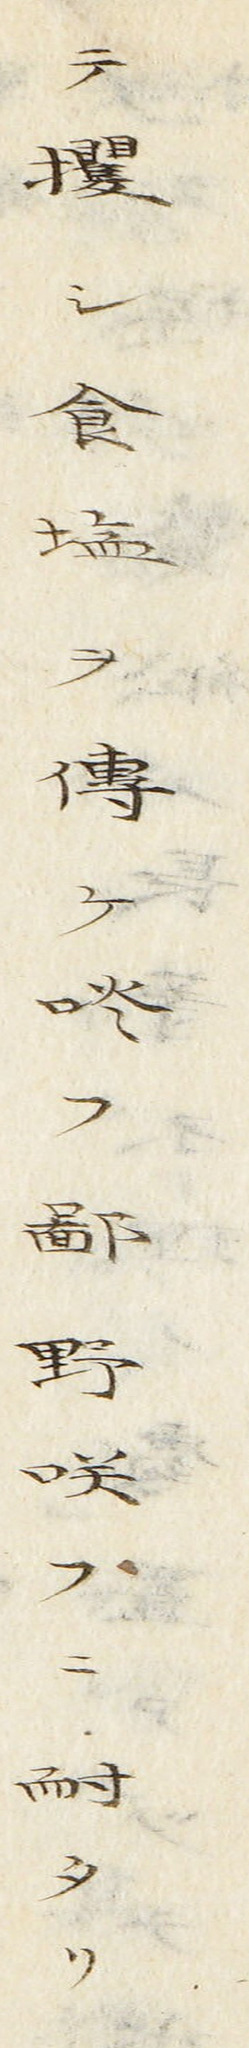テ攫シ食塩ヲ伝ケ啖フ鄙野咲フニ耐タリ
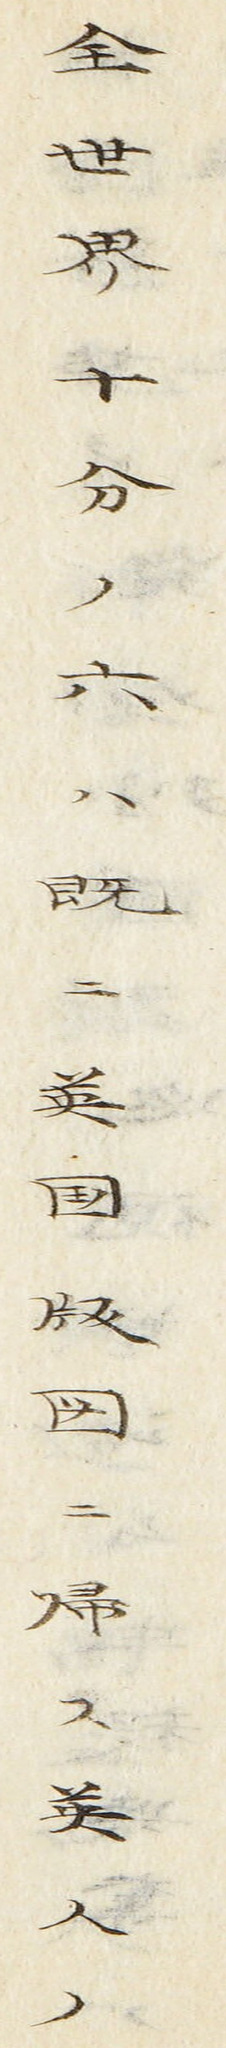全世界十分ノ六ハ既ニ英国版図ニ帰ス英人ノ
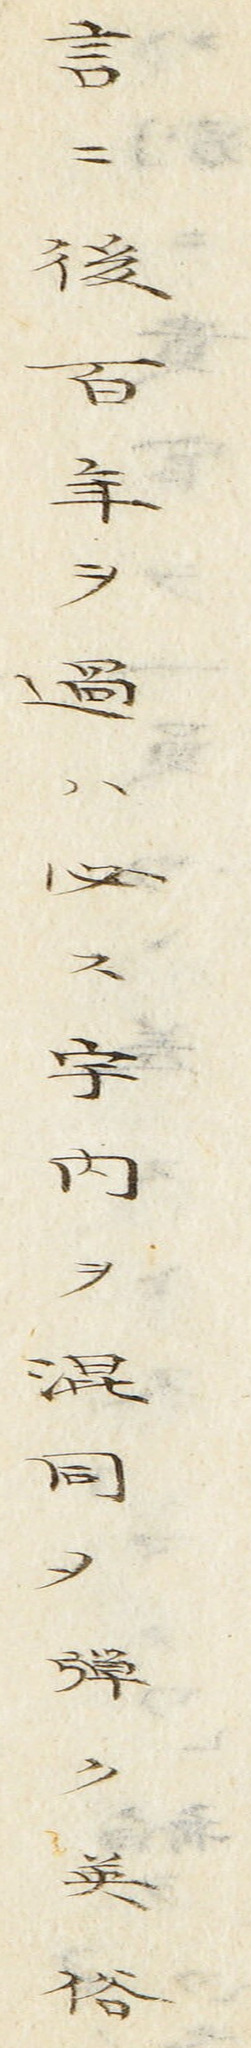言ニ後百年ヲ過ハ必ス宇内ヲ混同シテ弾ク英俗

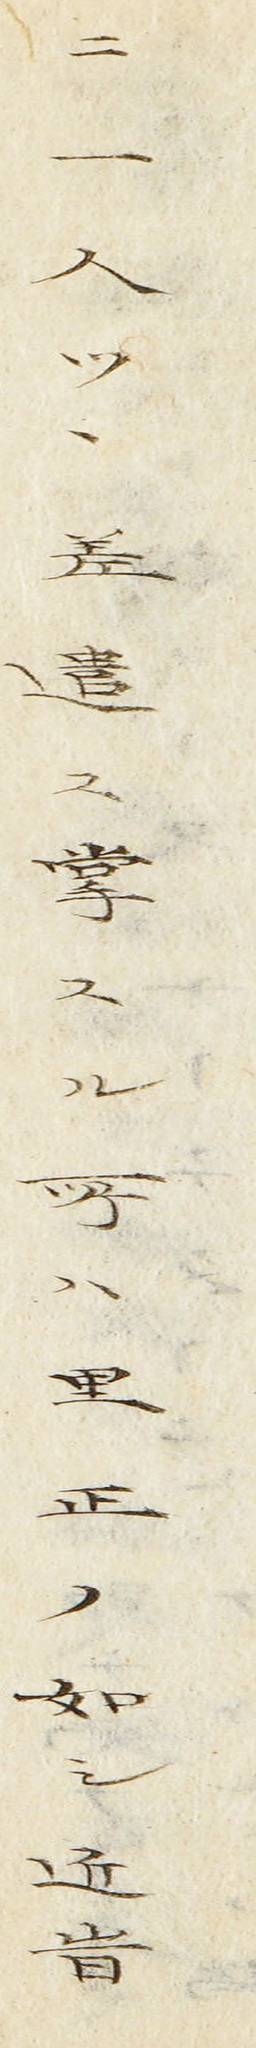ニ一人ツゝ差遣ス掌スル所ハ里正ノ如シ近時
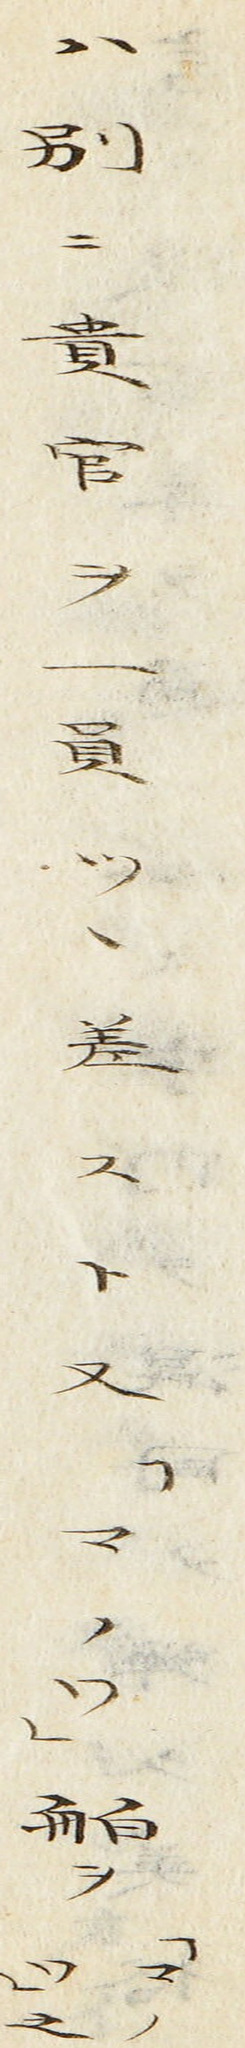ハ別ニ貴官ヲ一員ツゝ差スト又「マノワ」舶ヲ「マノワ」之
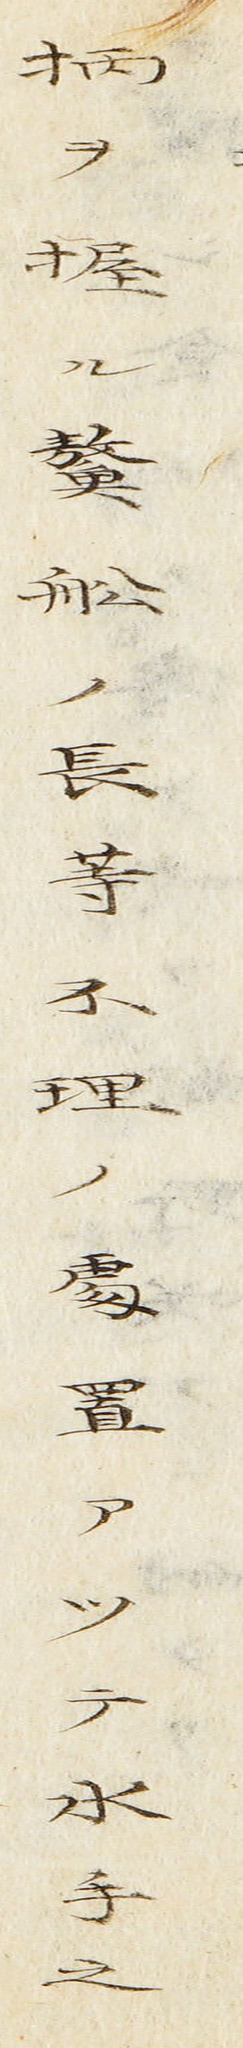柄ヲ握ル鰲舩ノ長等不理ノ処置アツテ水手之
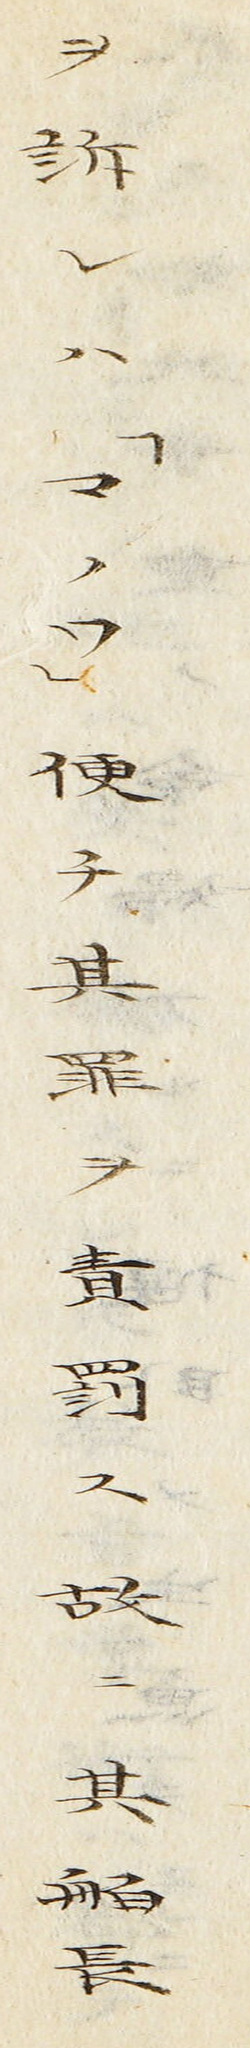ヲ訴レハ「マノワ」便チ其罪ヲ責罰ス故ニ其舶長
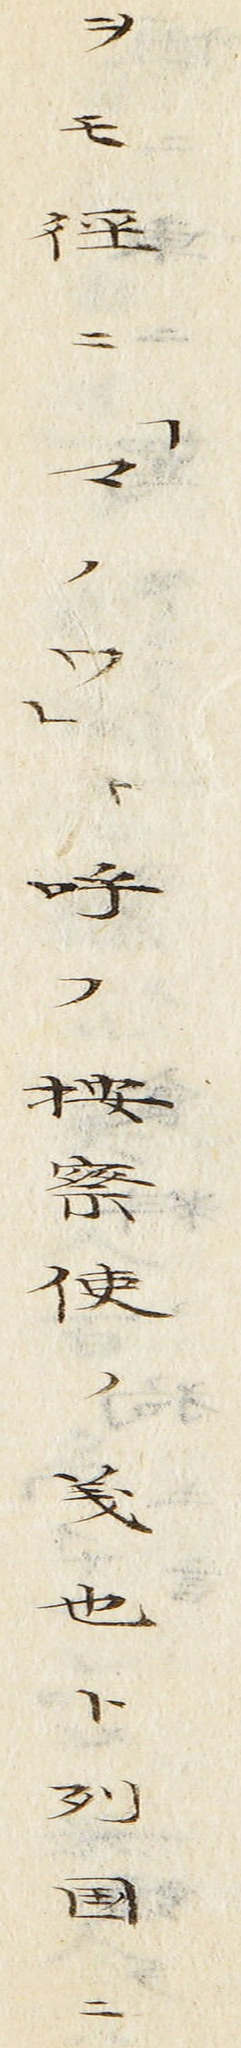ヲモ径ニ「マノワ」ト呼フ按察使ノ義？也ト列国ニ
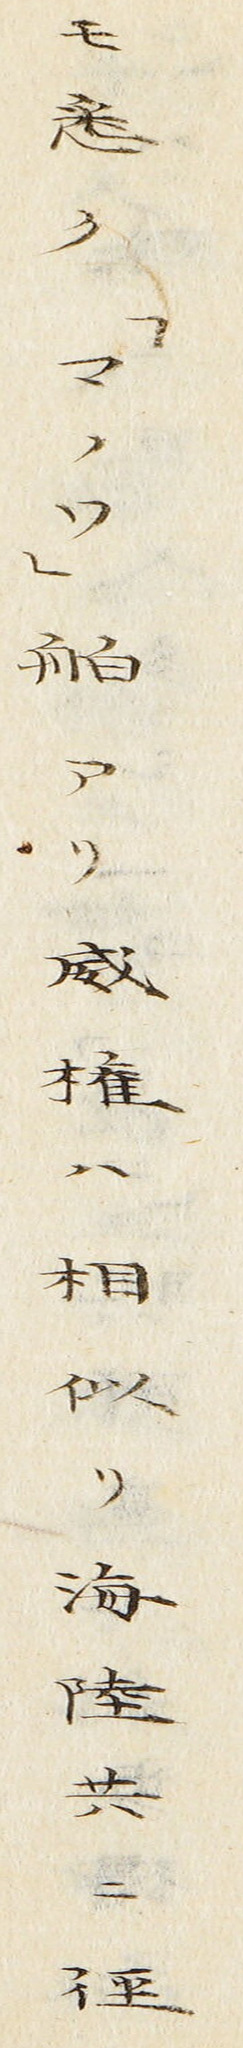モ悉ク「マノワ」舶アリ威権ハ相似リ海陸共ニ径
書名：蕃談
